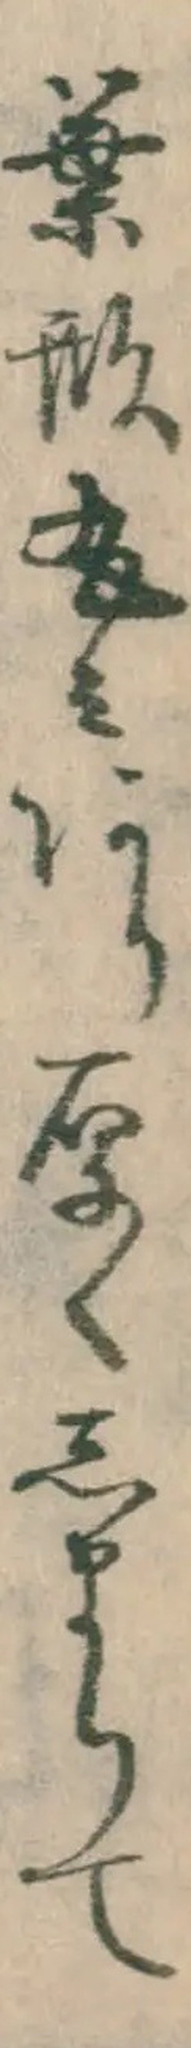若紫葉形丸みあり厚くしまりて
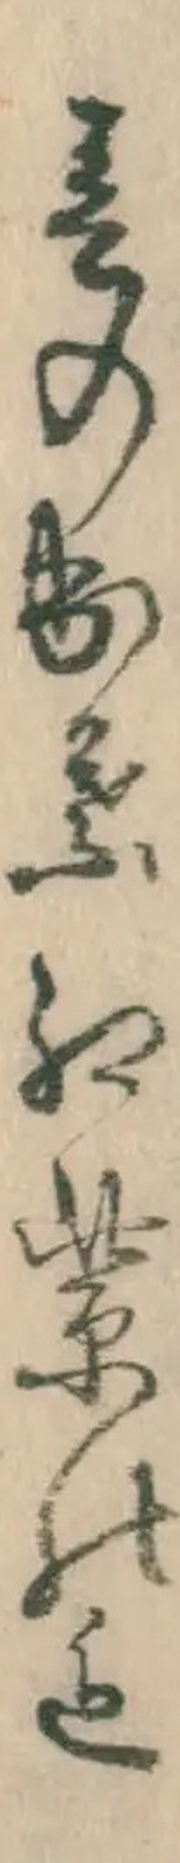春の出葉紅紫の色
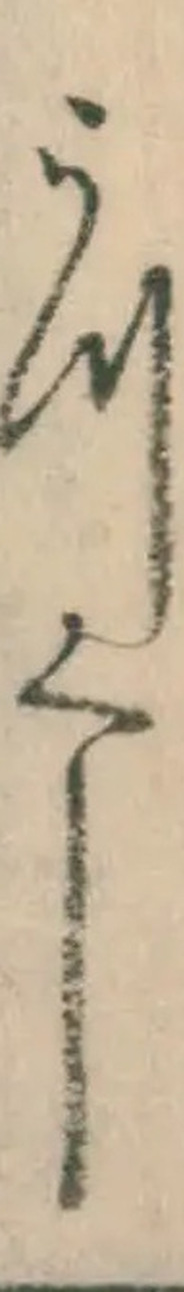うつくし
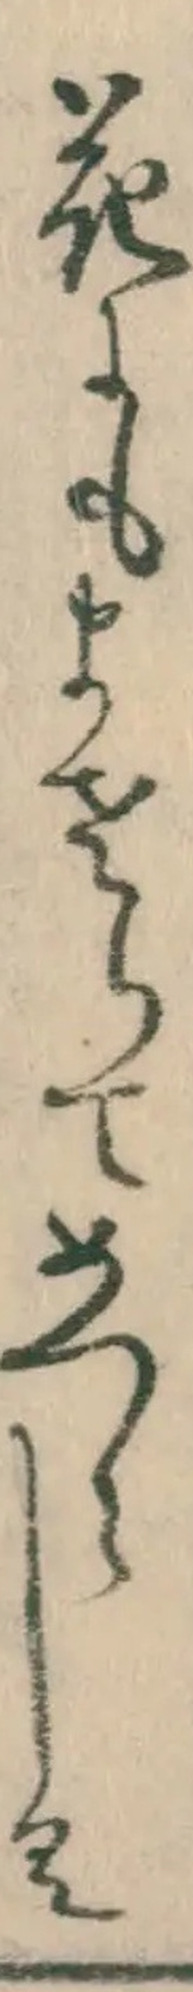花にもまさりてめつら
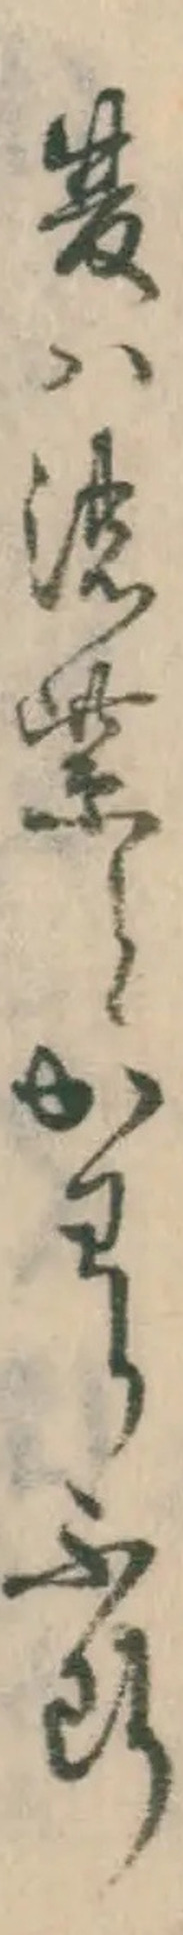夏は濃紫にかわり不断
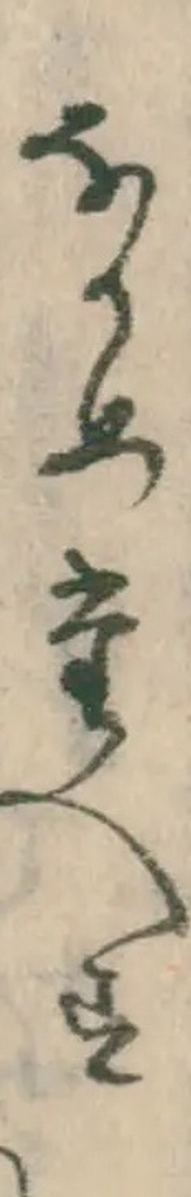なかめたへす
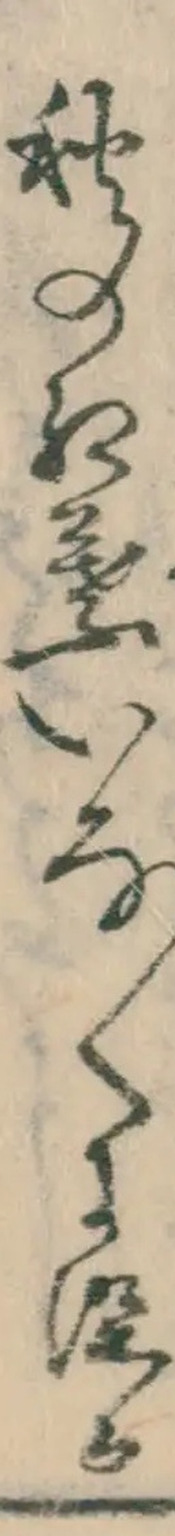秋の紅葉いな〳〵に染る
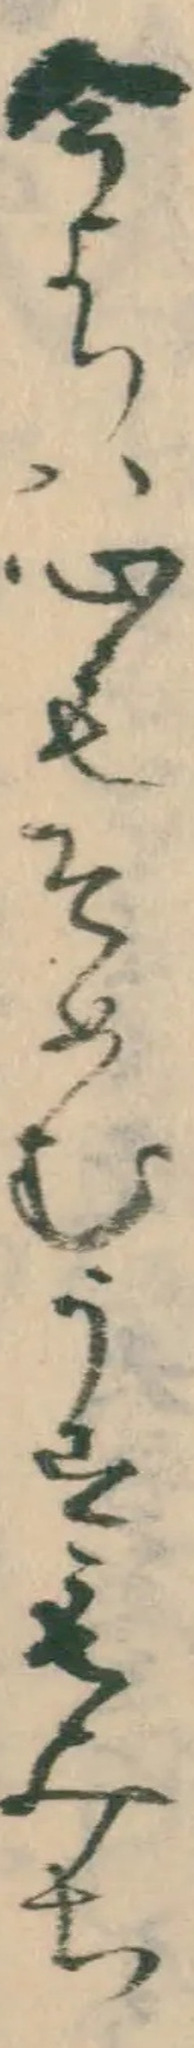今よりは心もそめむうすもみち
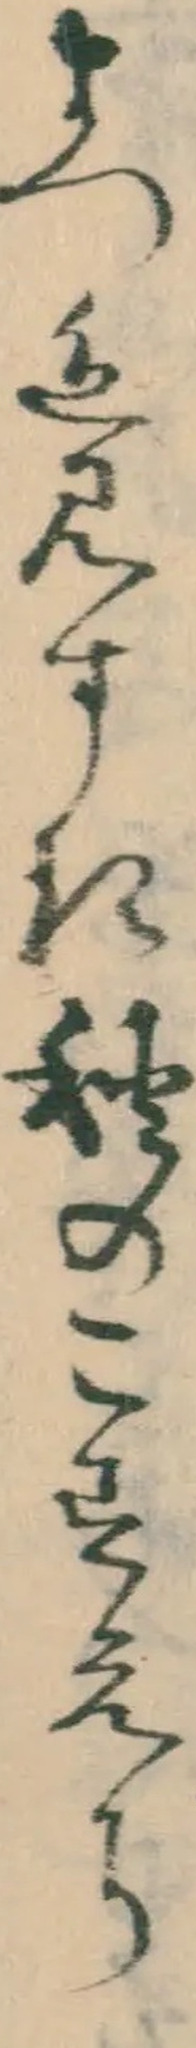まつ色見する秋のこすえに
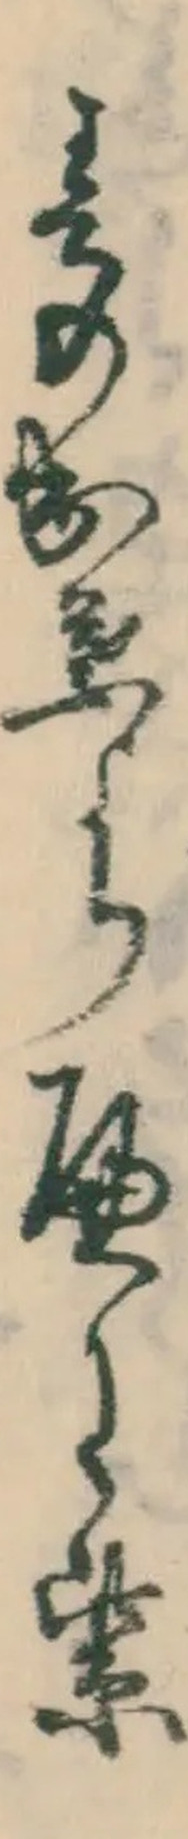春の出葉よりへに紫
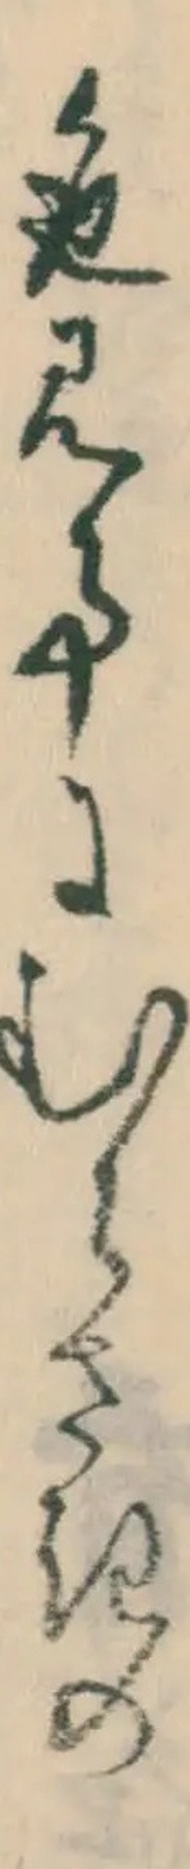色見事にむらさきの
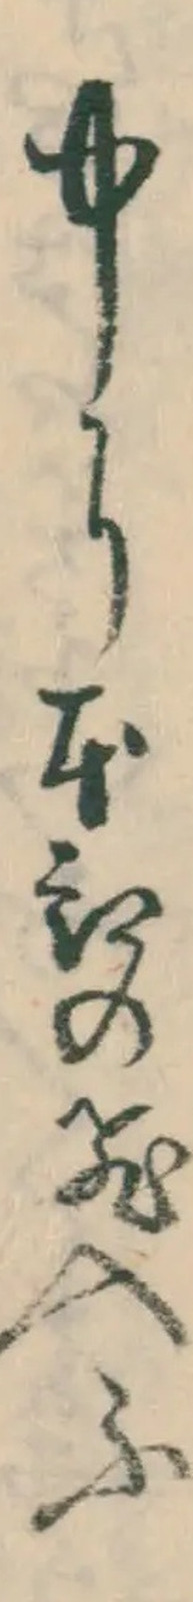中に本紅の飛入ふ
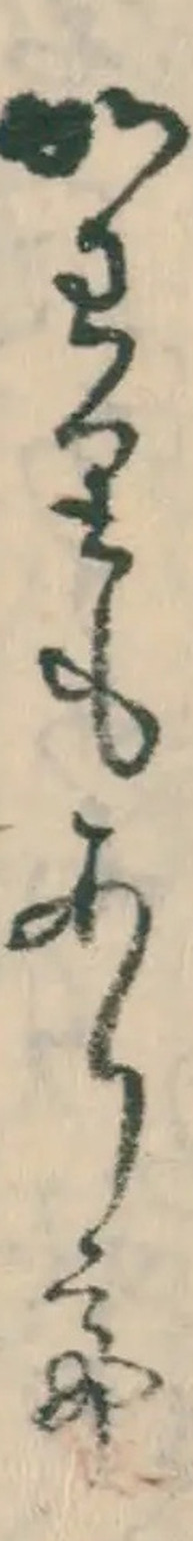かわりもありて
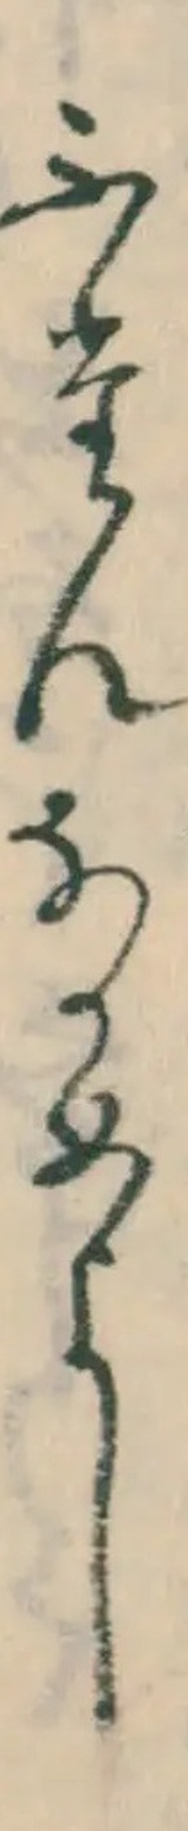ふたんなかめよし
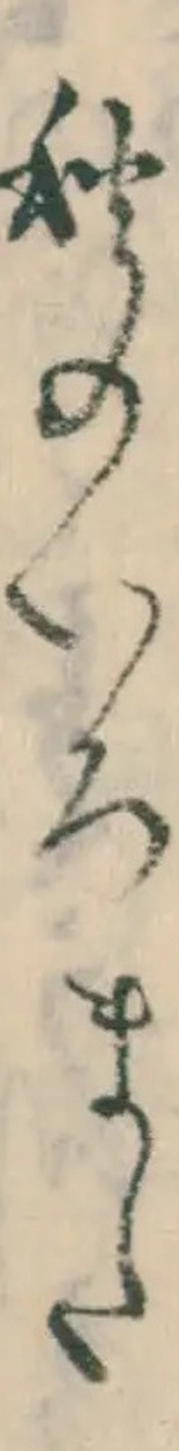秋のいろまた
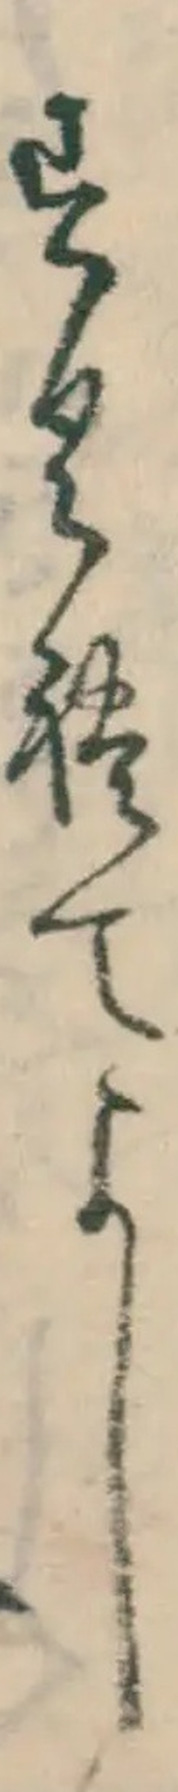すくれてよし
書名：紅葉集
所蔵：国立国会図書館 National Diet Library, JAPAN
